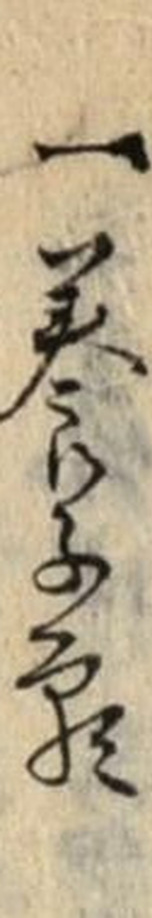一養子願
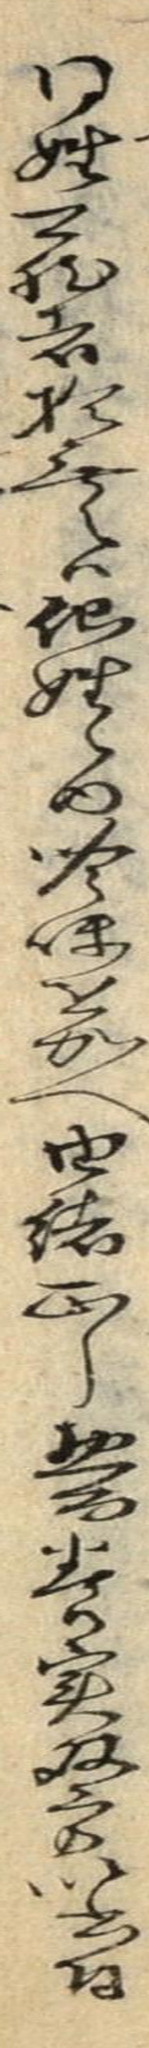同姓可然者於無之ハ他姓之内吟味を加へ由緒正し惣而養実双方以書付
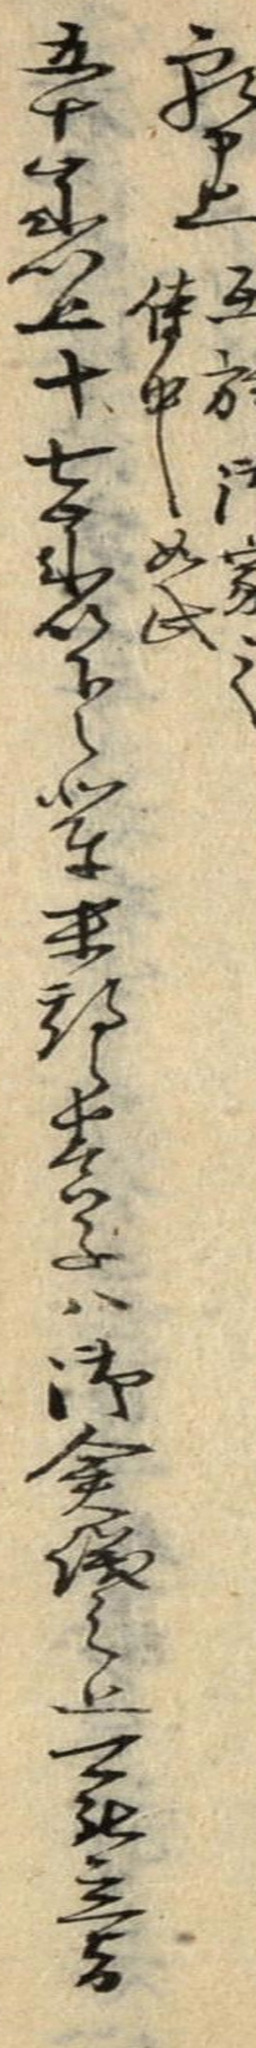五十歳以上十七歳以下之輩末期養子ハ御僉議之上可被立旨

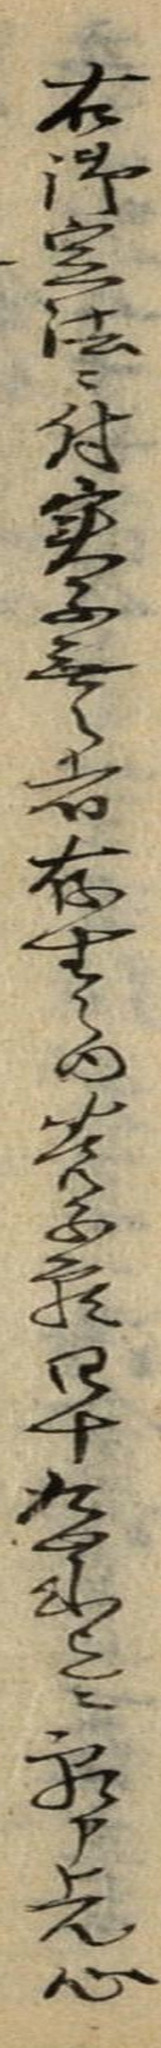右御定法ニ付実子無之者存生之内養子願四十九歳迄ニ願申上ル心
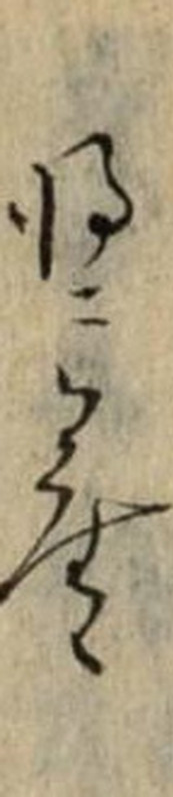得ニ御座候
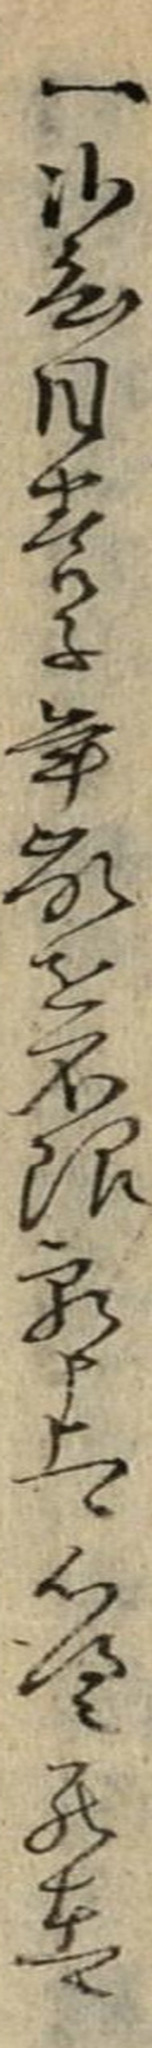一弐度目養子年齢を不限願申上候心得ニ罷在候
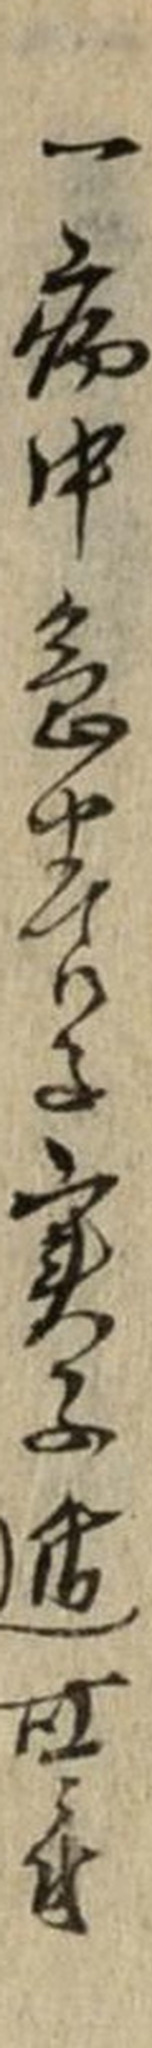一病中急養子実子遁世ニ付
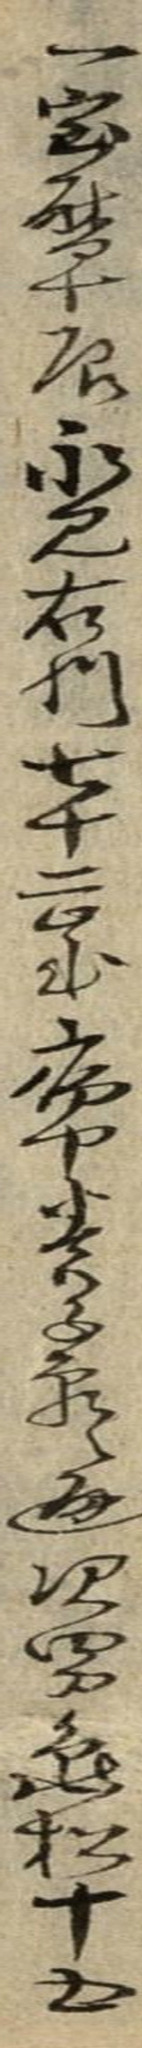一宝暦十辰永見右門七十二歳病中養子願之通次男亀松十五
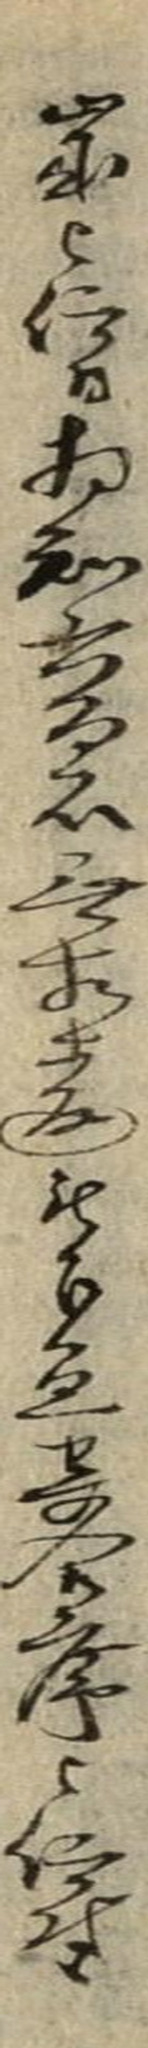歳被仰付拝知六百石無相違被下置寄合席被仰付候
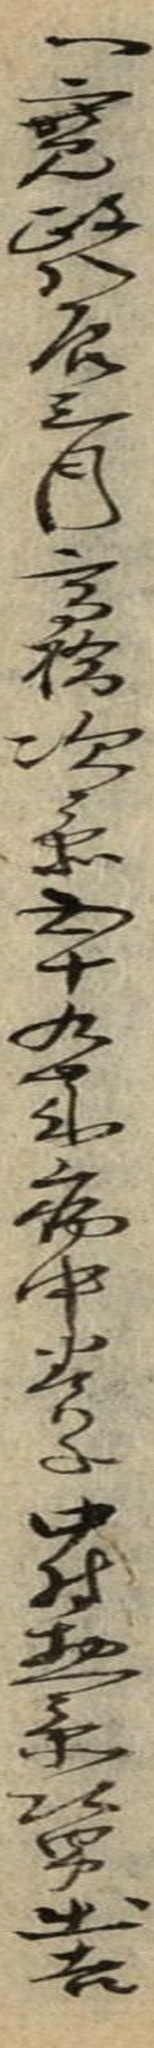一寛政八辰三月高橋次兵衛五十九歳病中養子中村惣兵衛次男出吉
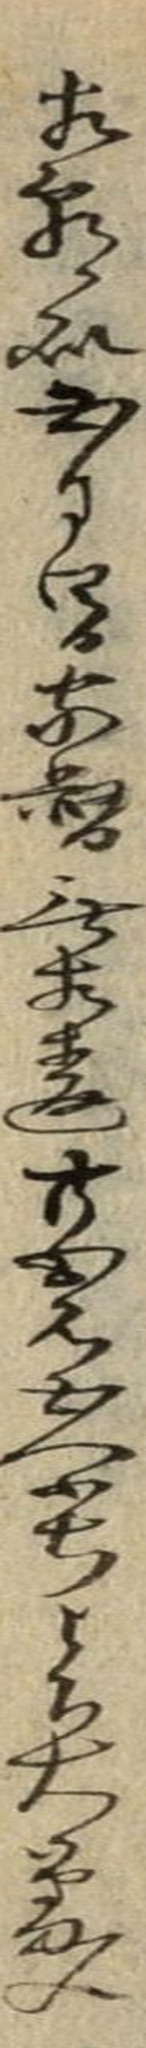相願候処五月四日家督無相違廿五石五人ふち被下大御番入
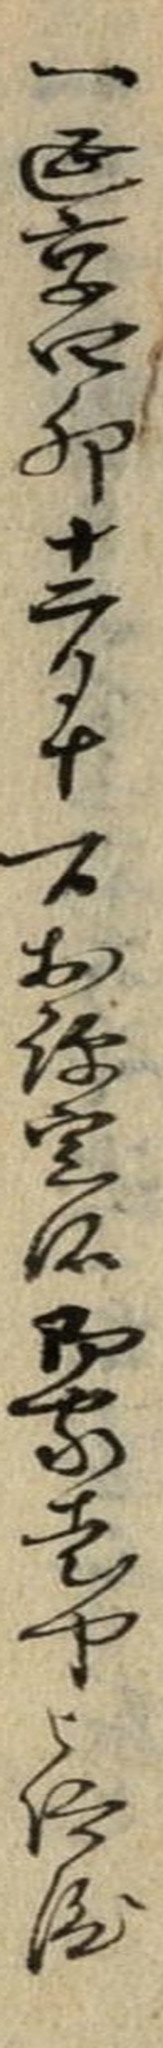一延享四卯十二月十一日於評定所御家老中被仰渡
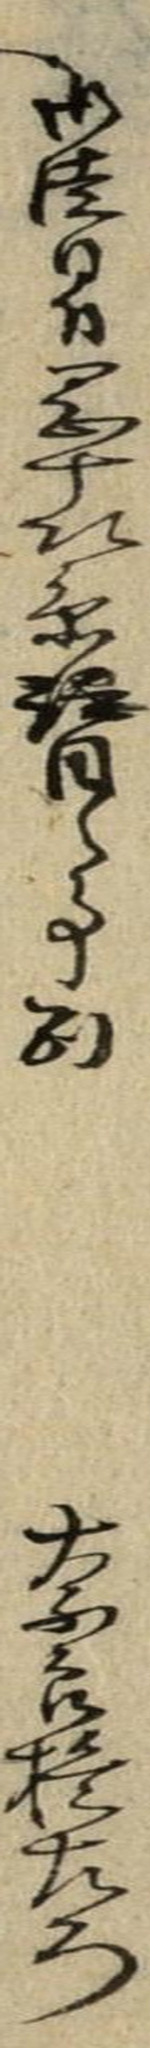御徒目付岡十次兵衛跡目之事別奈良権左衛門
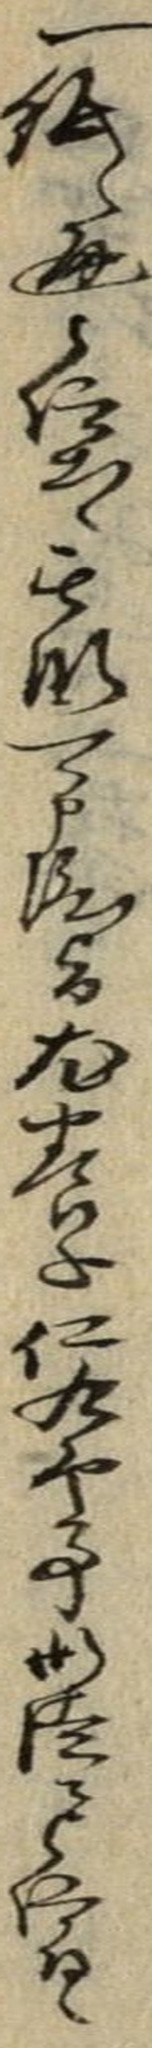紙之通被仰出候其段可申渡旨尤養子仁九郎事御徒被仰付候
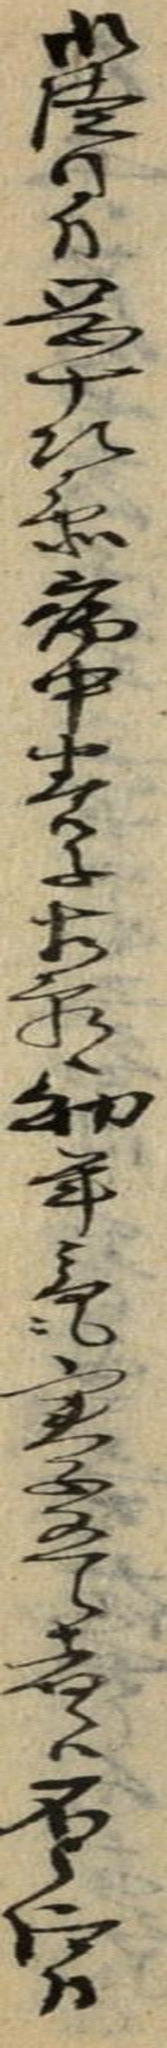御徒目付岡十次兵衛病中養子相願候幼年ニ而実子有之者ニハ不被仰付
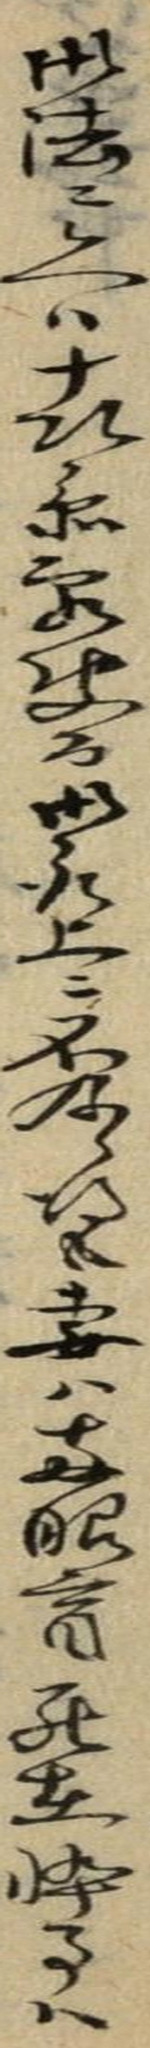御法ニ候へハ十次兵衛願決而御取上ニ不及候得共妻ハ両眼盲罷在悴事ハ
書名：養子縁組之部
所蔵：福井県文書館 Fukui Prefectural Archives
